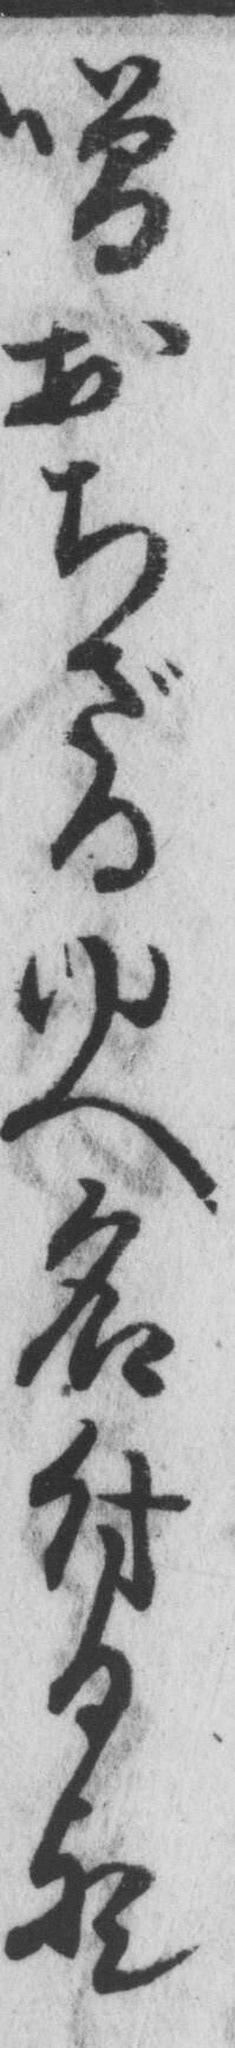噌おちざるゆへ名付る歟
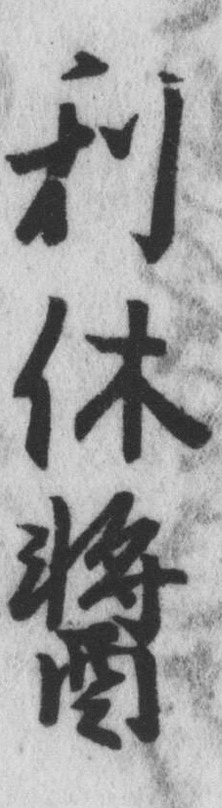利休醤
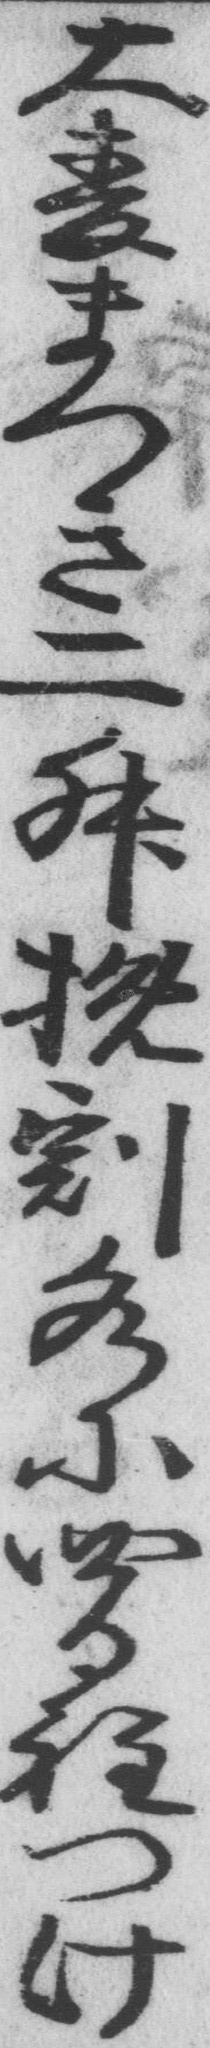大麦まつき二升挽割水に四日程つけ
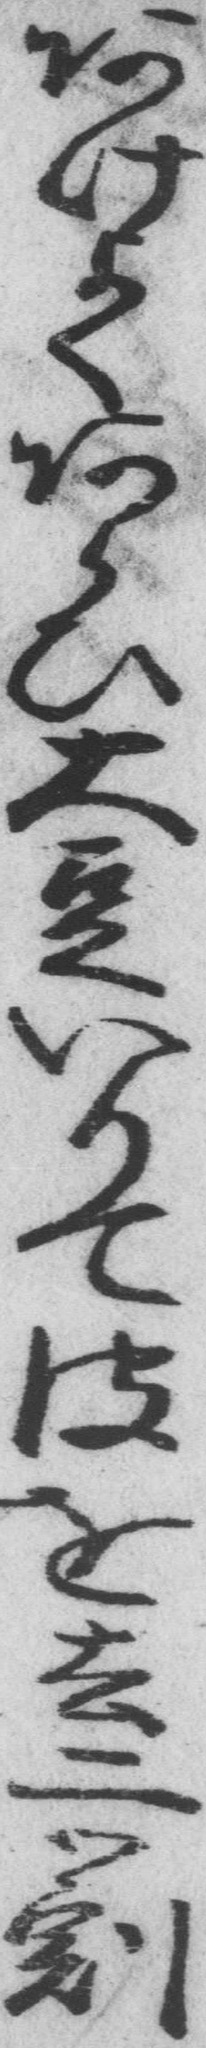あけよくあらひ大豆いりて皮を去二ツ割
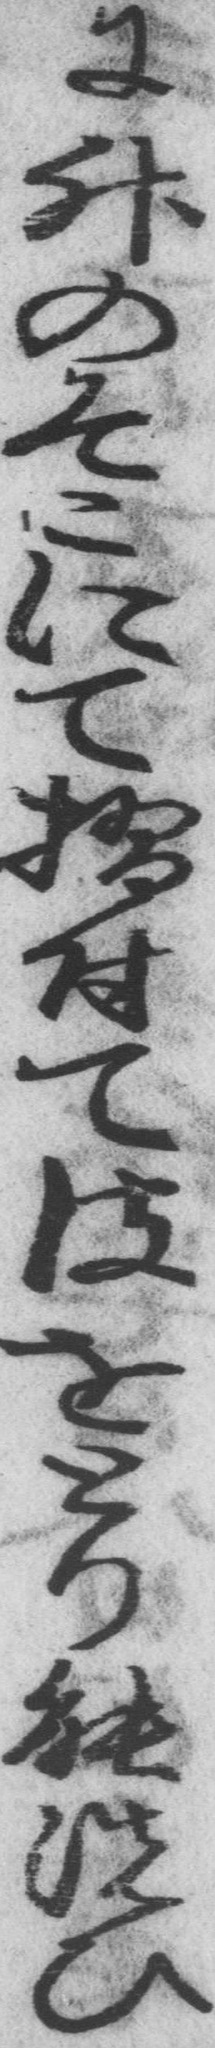に升のそこにて摺付て皮をとり能洗ひ
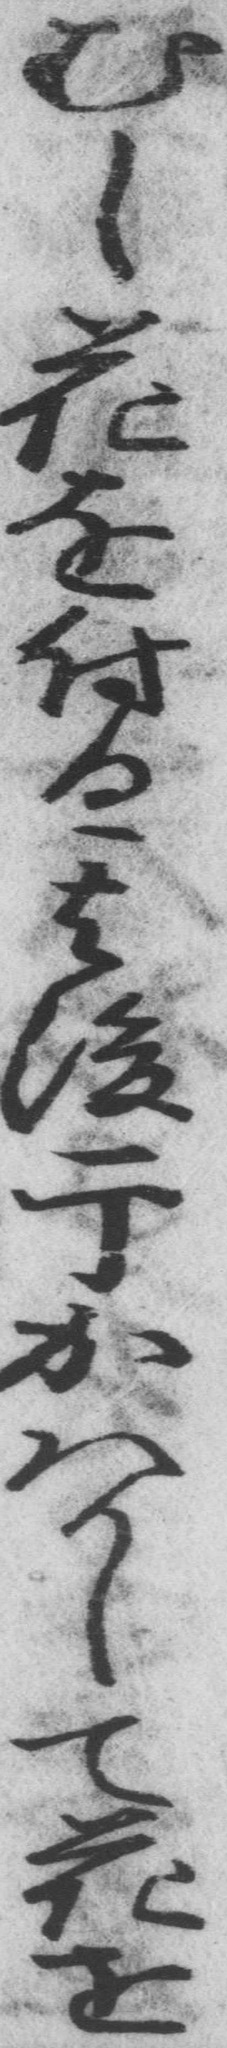むし花を付る其後干かはかして花を
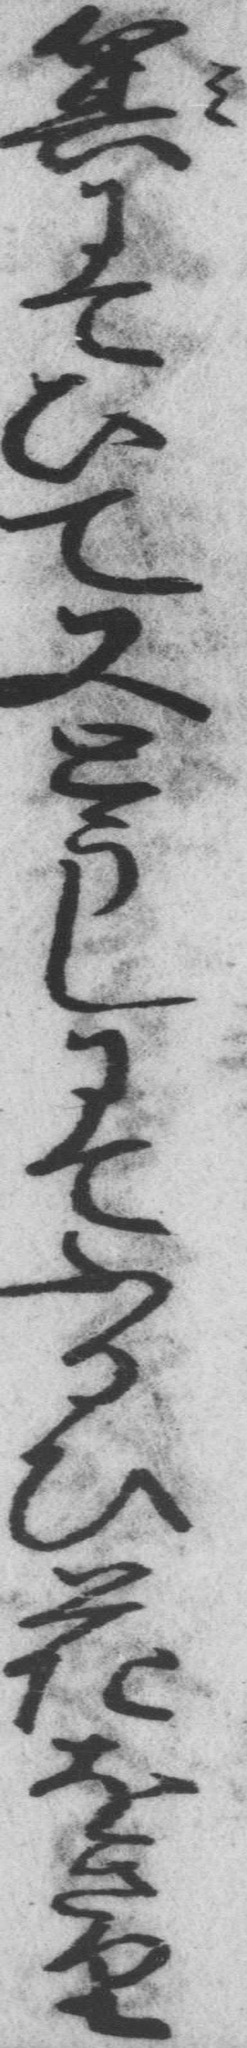箕にてひて又とうしにてふるひ花をさり
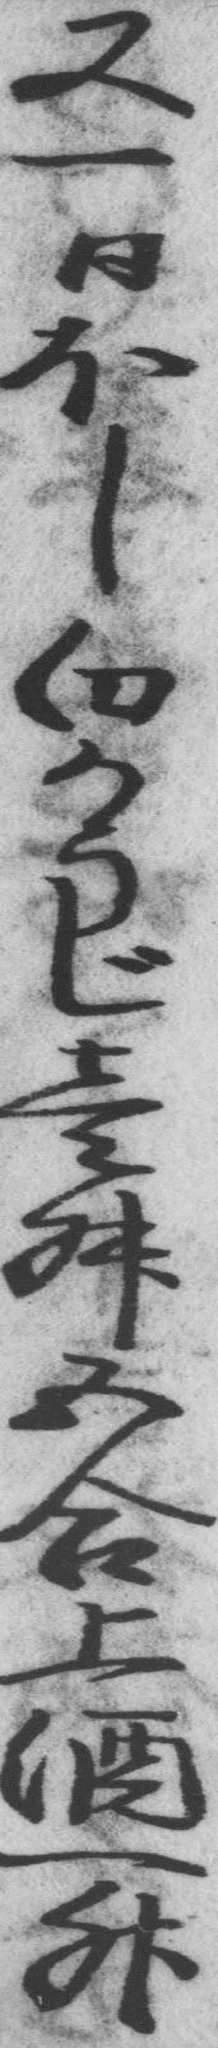又一日ほし白かうじ壱升五合上酒一升
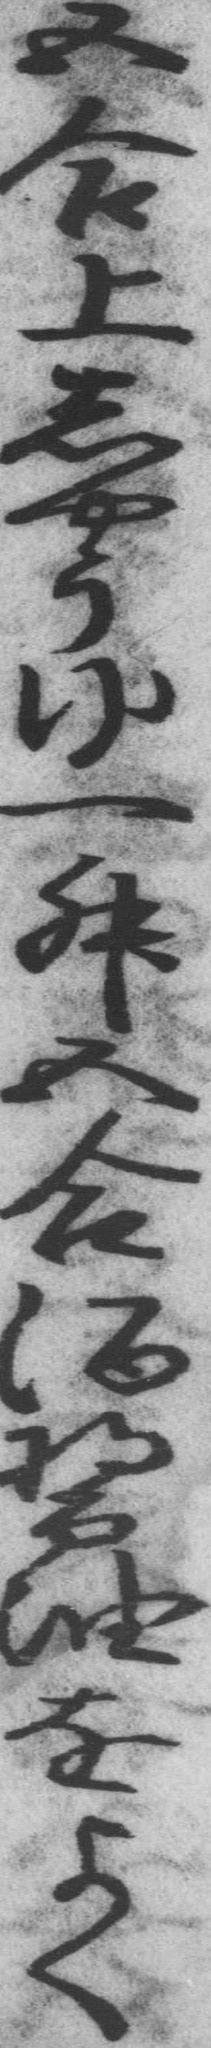五合上しやうゆ一升五合酒醤油をよく

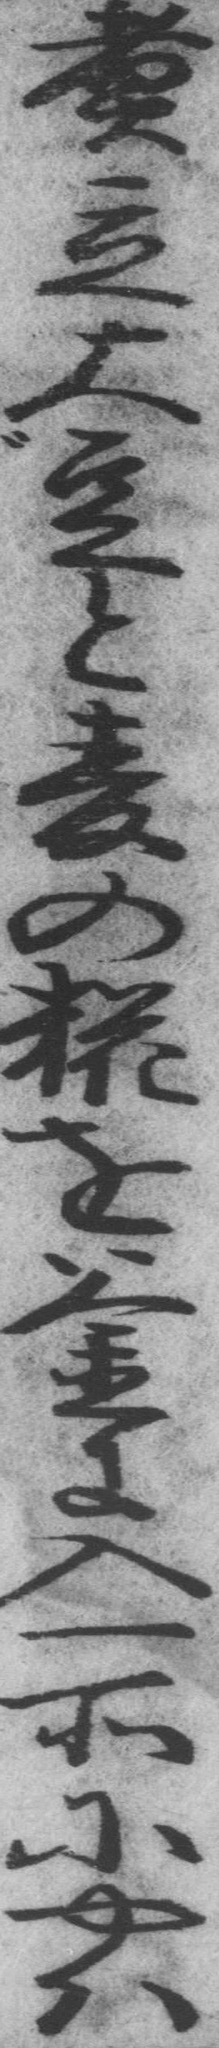煮豆大豆と麦の糀を釜に入一所にやは
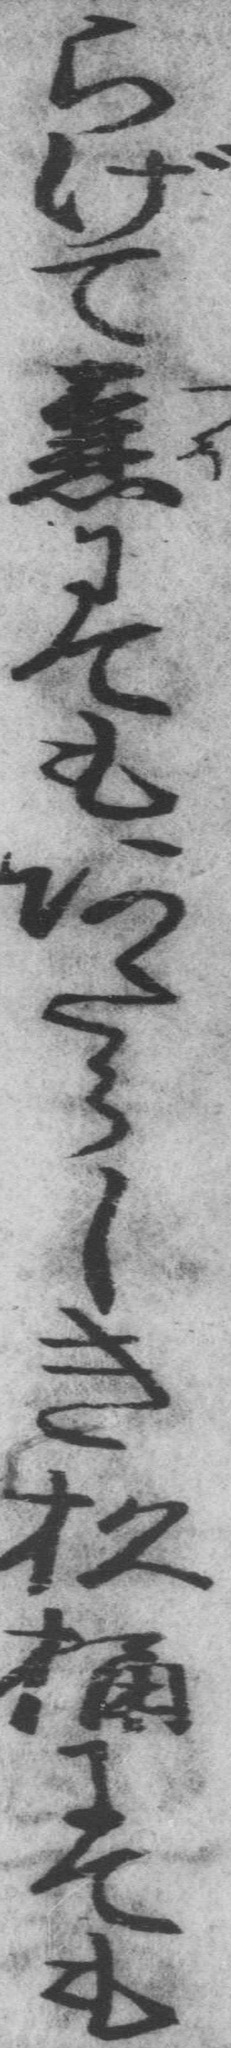らげて壺にてもあたらしき杉桶にても
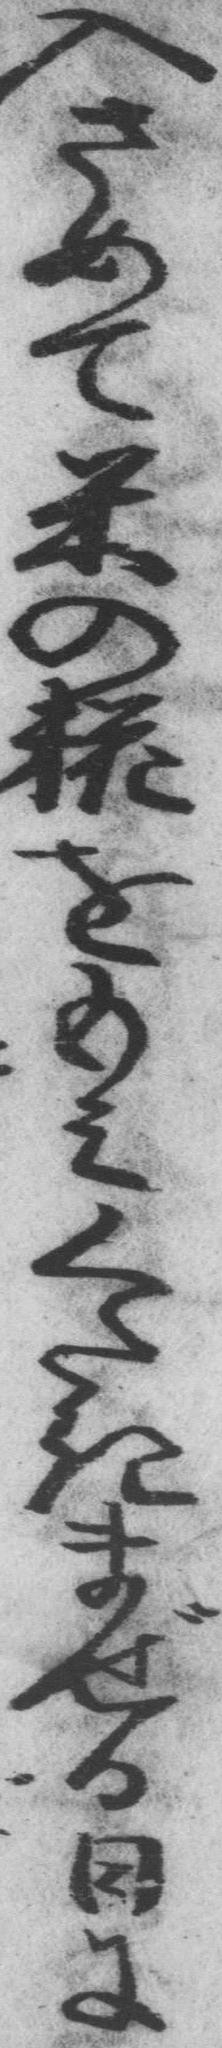入さめて米の糀をもみくたきまぜる日に
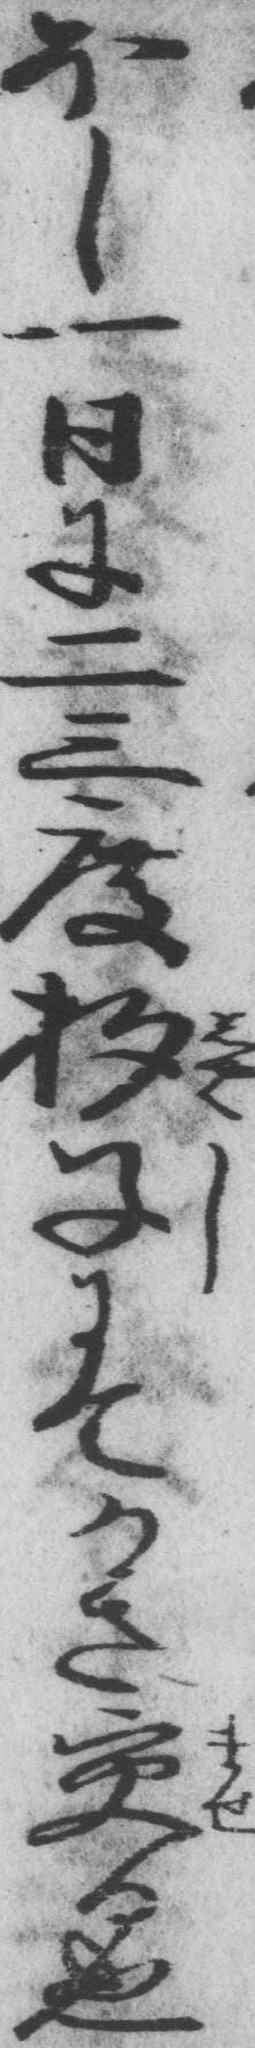ほし一月に二三度杓子にてかき交る也
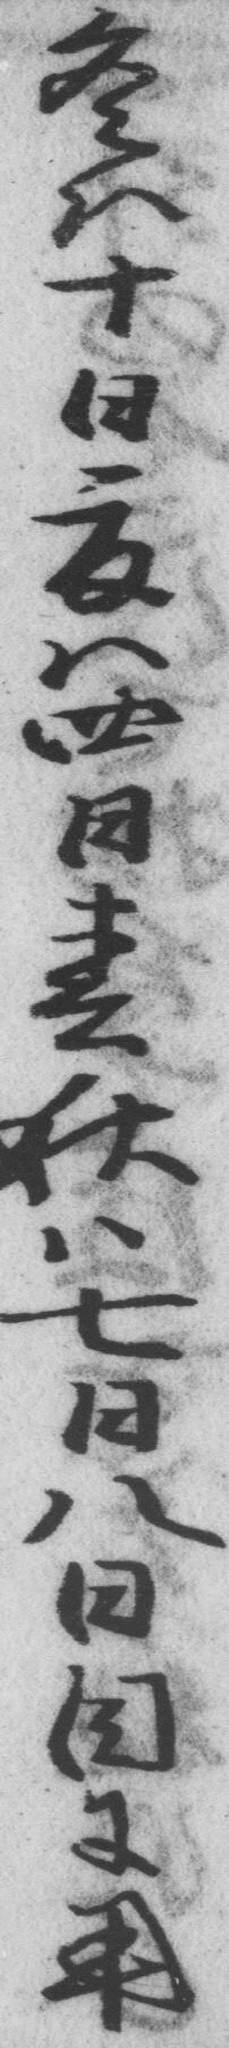冬は十日夏は四日春秋は七日八日目に用
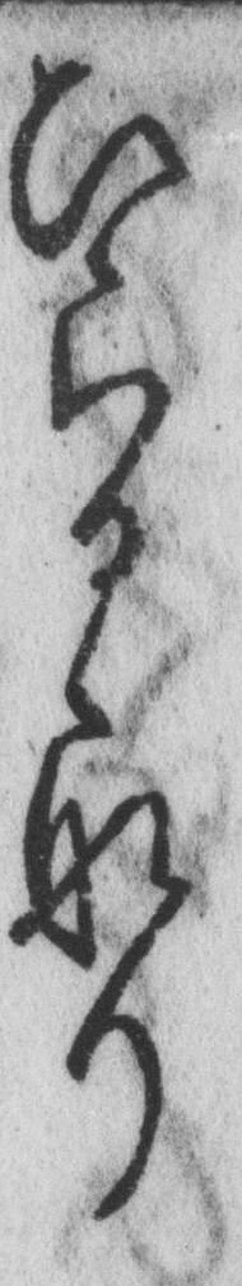ひらるゝなり
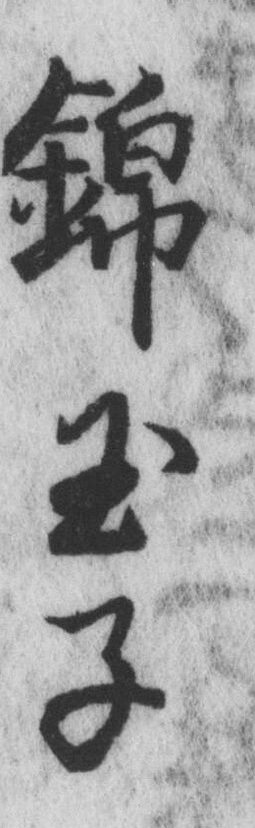錦玉子
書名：料理山海郷
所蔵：大阪府立大学学術情報センター 国文学研究資料館
